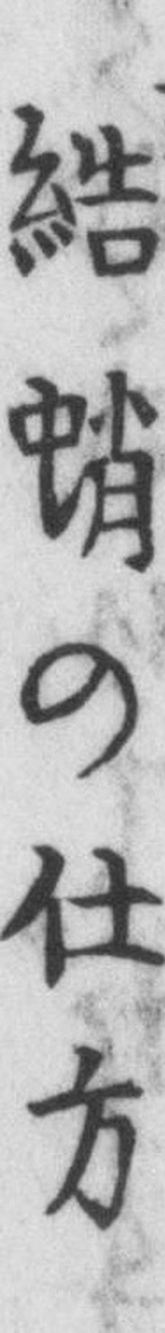結蛸の仕方
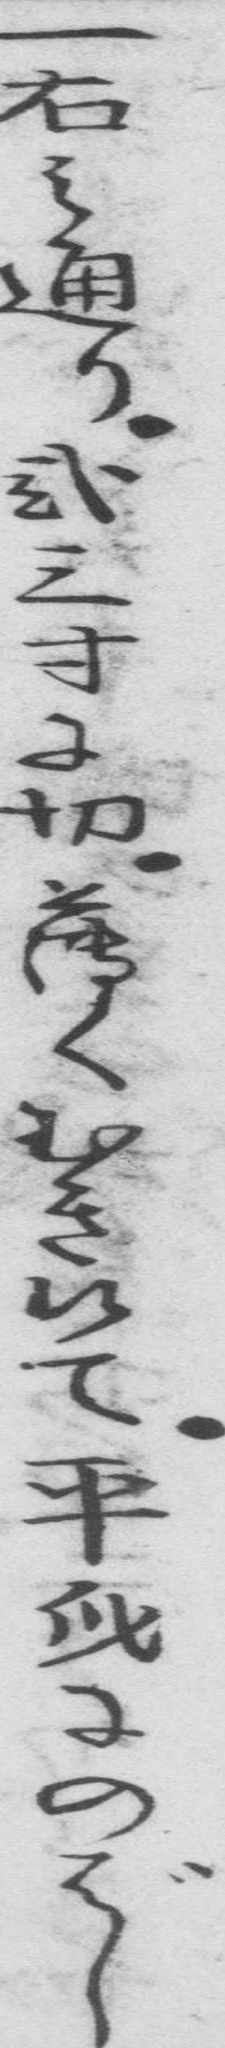一右之通り。弐三寸に切。薄くむき候て。平身にのばし
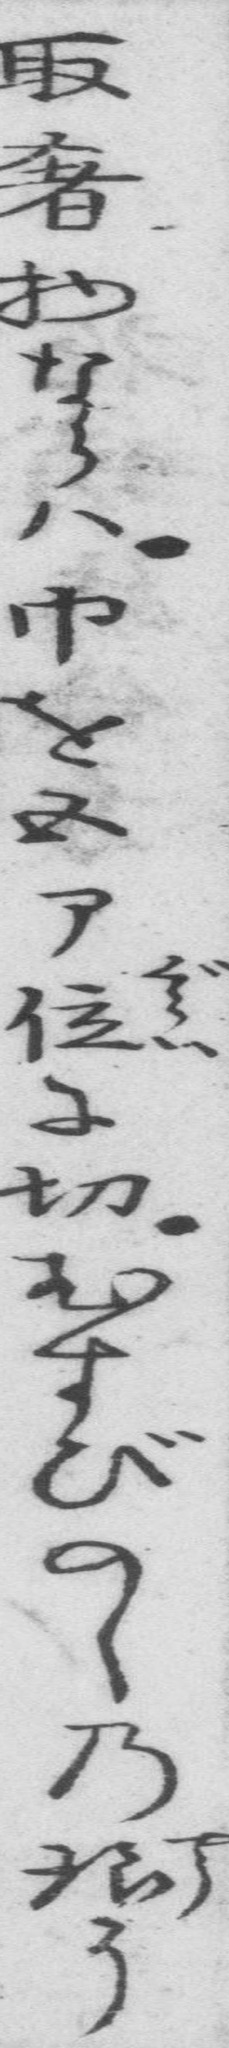取肴物ならは。巾を五分位に切。むすびのしの様に
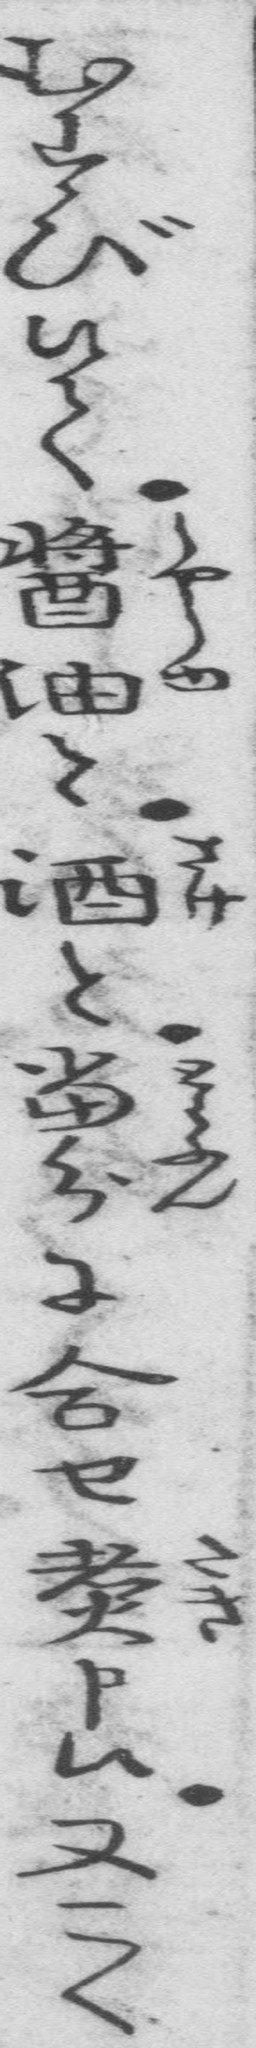むすび候て。醤油と。酒と。当分に合せ煮申候。又こく
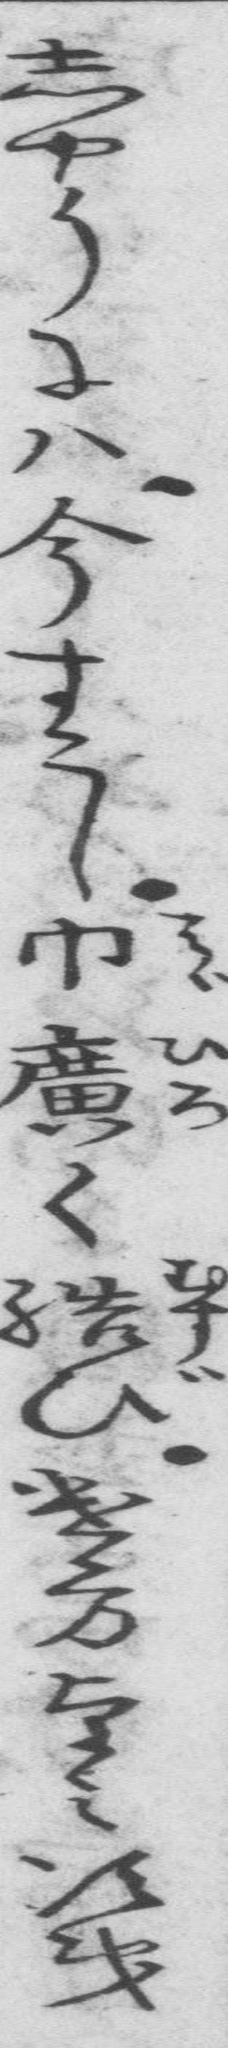しやうには。今すこし。巾広く結び。遣方望み次第
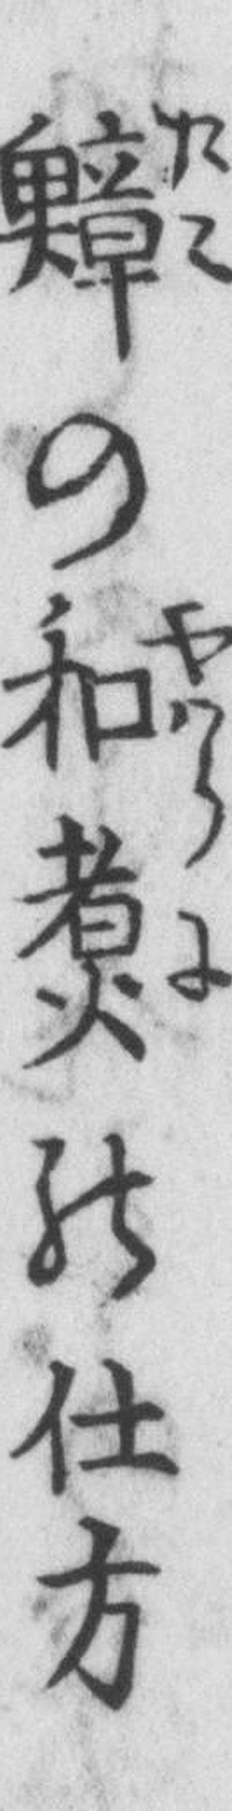鱆の和煮の仕方
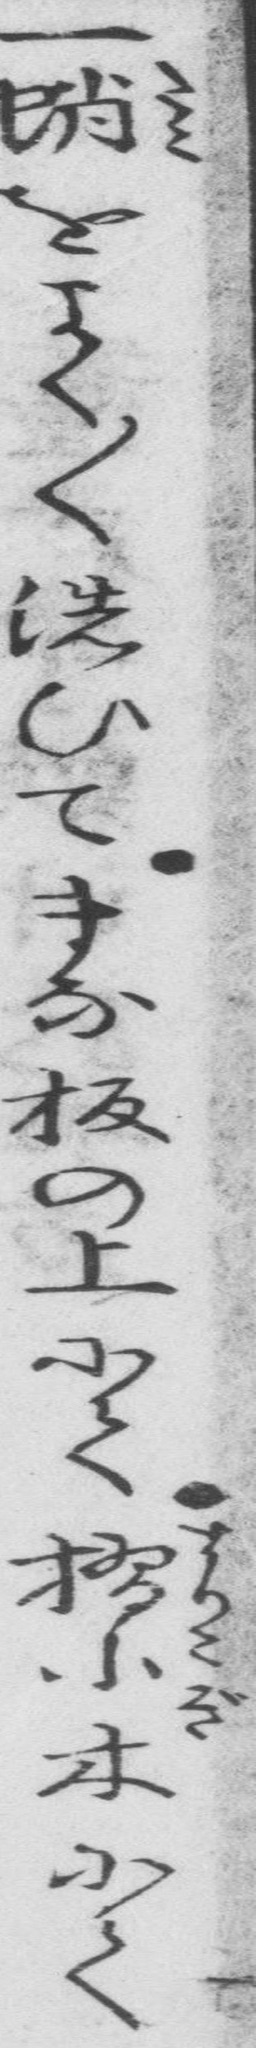一蛸をよく〳〵洗ひて。まな板の上にて。摺小木にて
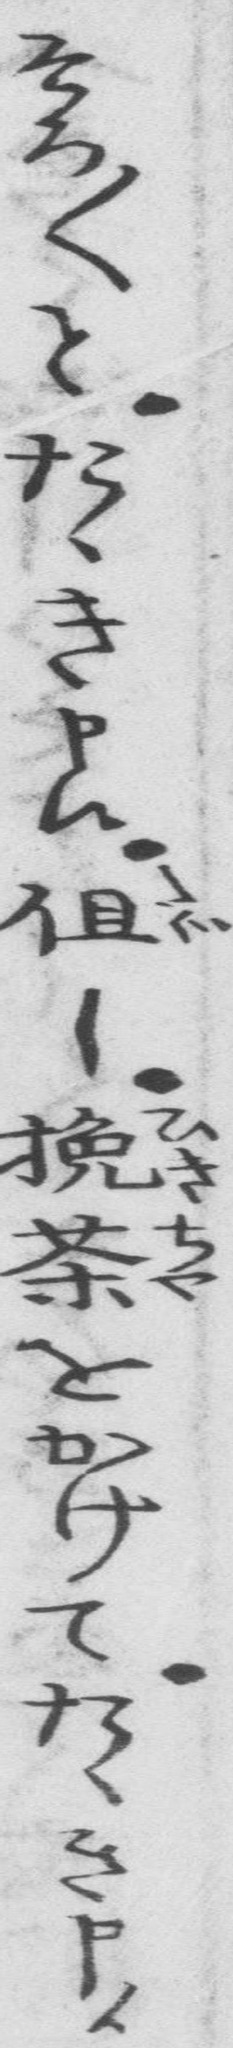そろ〳〵と。たゝき申候。但し。挽茶をかけて。たゝき申候
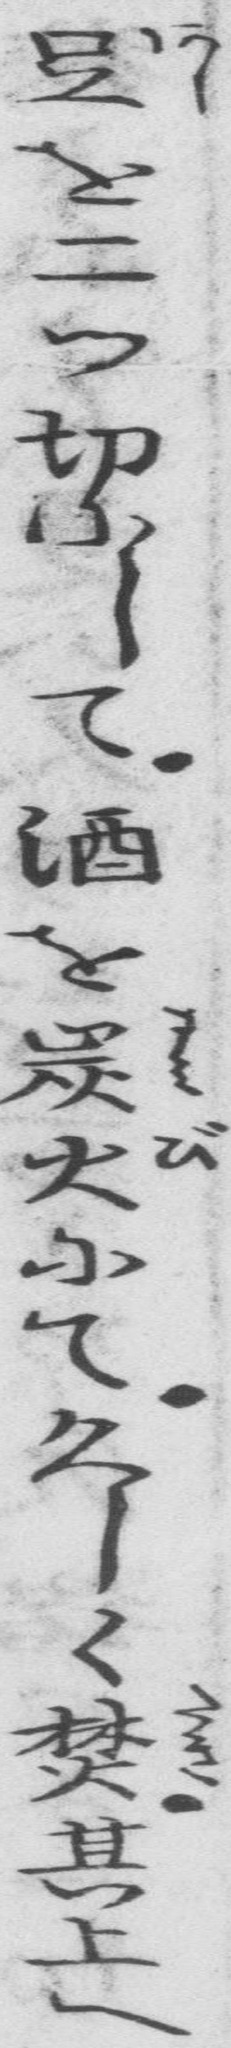足を二ツ切にして。酒を炭火にて。久しく焚。其上へ
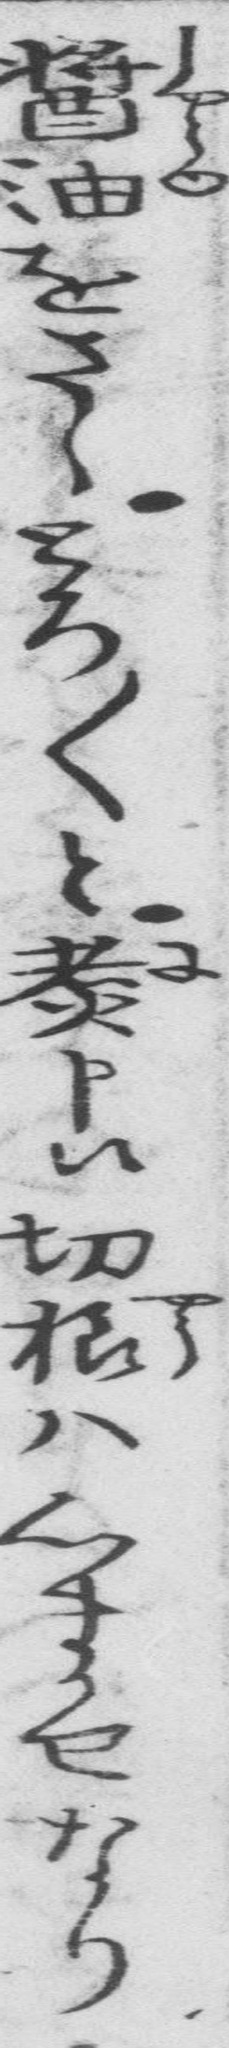醤油をさし。とろ〳〵と煮申候切様は心まかせなり
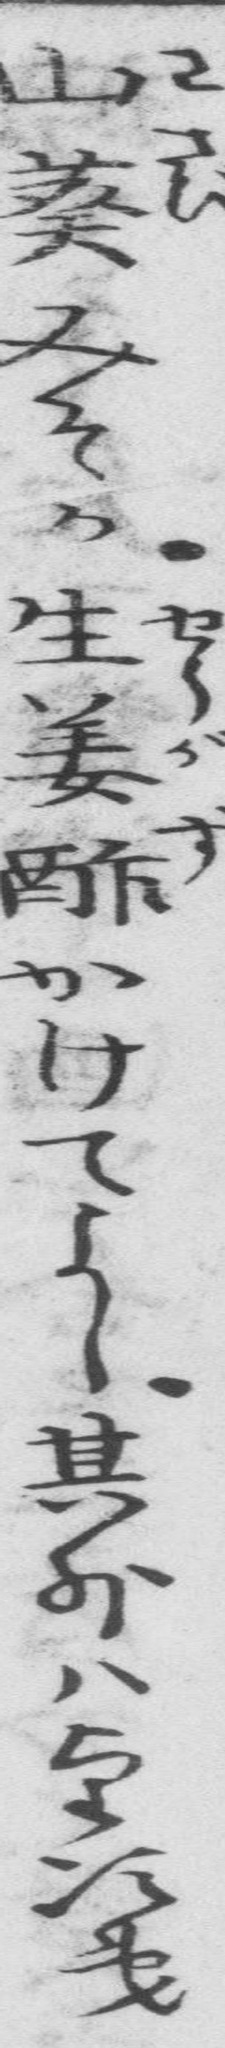山葵みそか。生姜酢かけてよし。其外は望次第
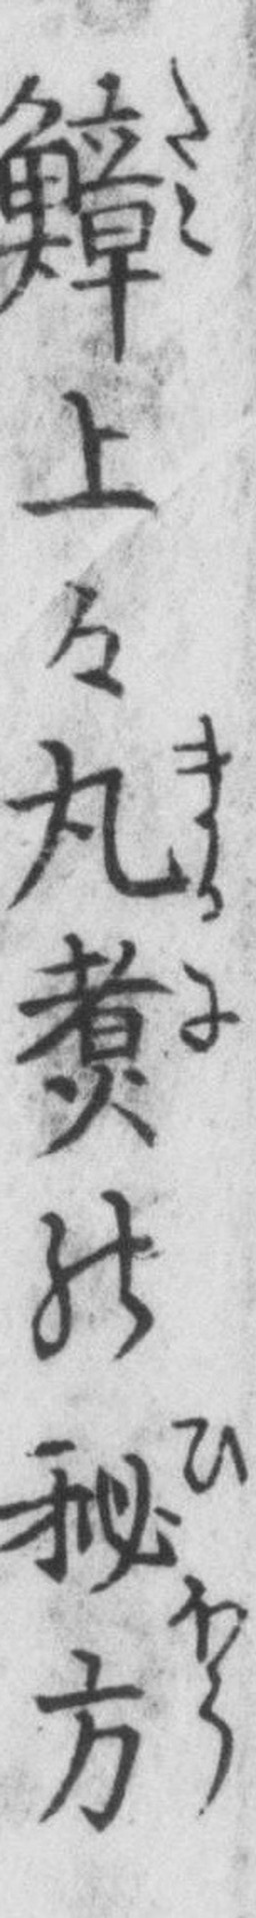鱆上々丸煮の秘方
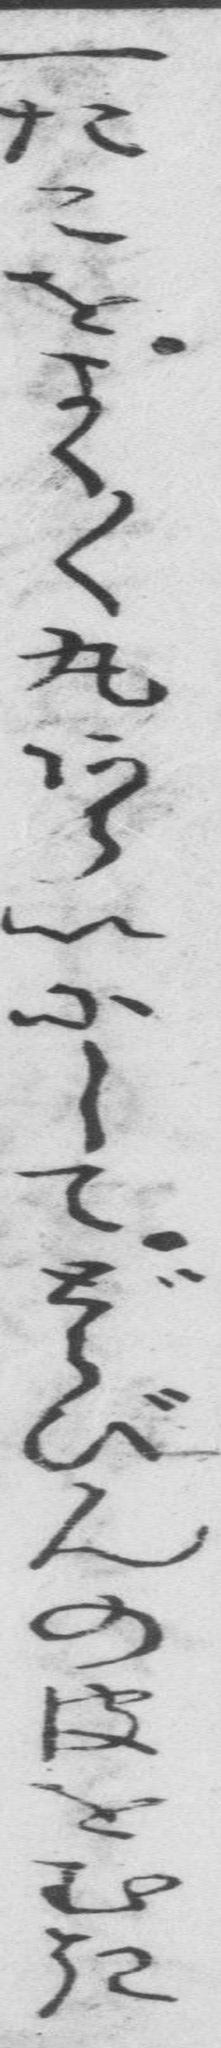一たこを。よく〳〵丸あらいにして。どうびんの皮をむき
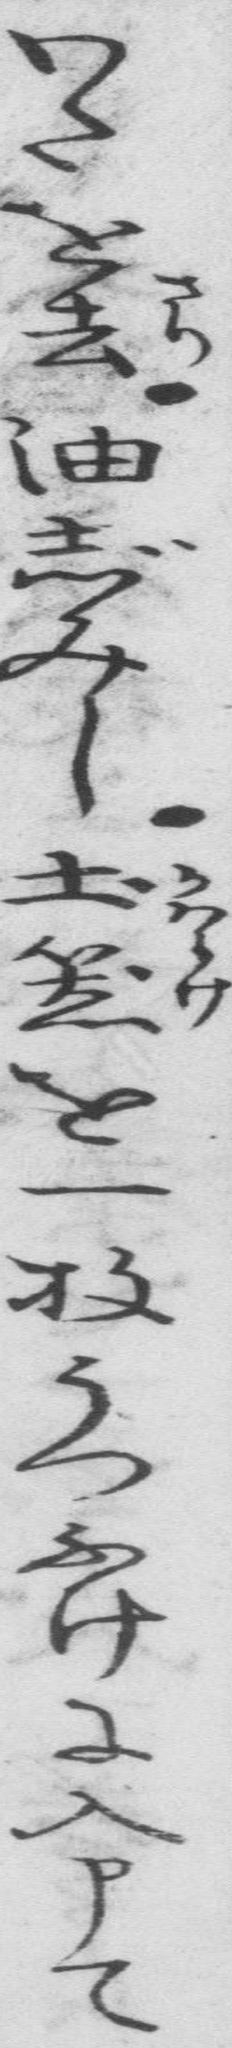わたを去。油じみし。土器を一枚うつふけに入申て
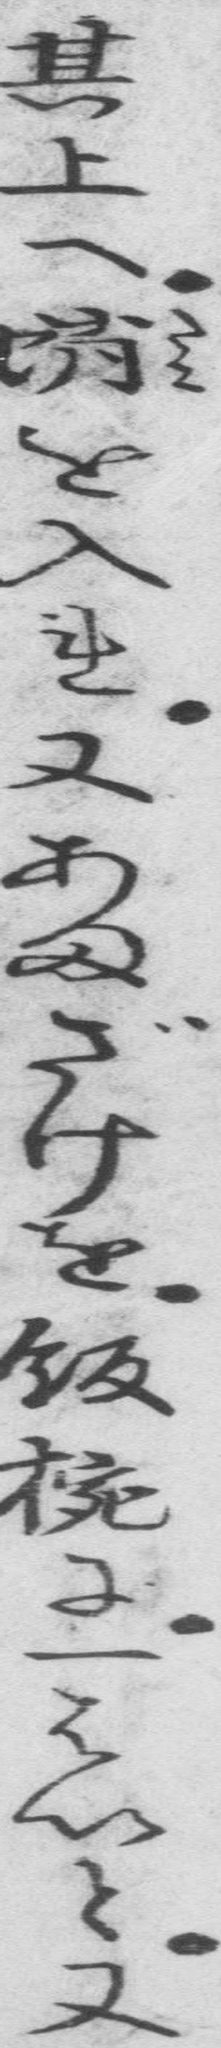其上へ。蛸を入れ。又あまざけを。飯椀に。一はいと。又

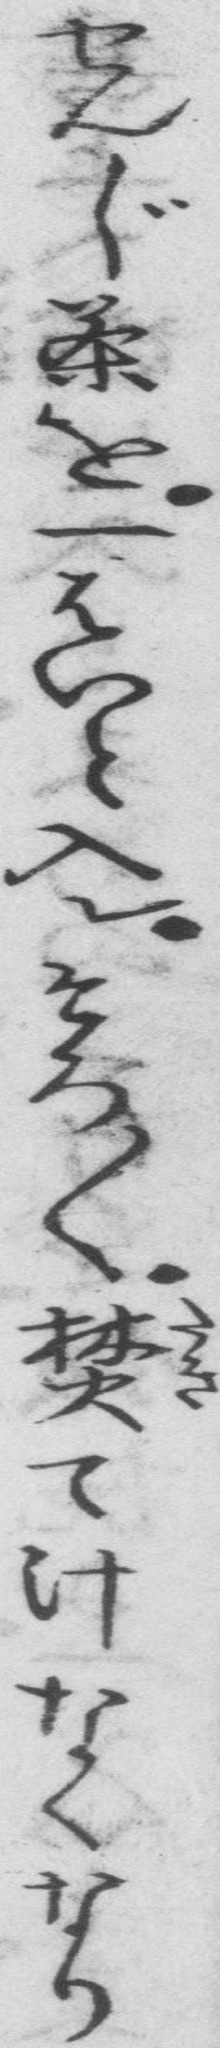せんじ茶を。一はいと入れ。そろ〳〵。焚て汁なくなり
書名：萬寳料理秘密箱
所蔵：大阪府立大学学術情報センター 国文学研究資料館
